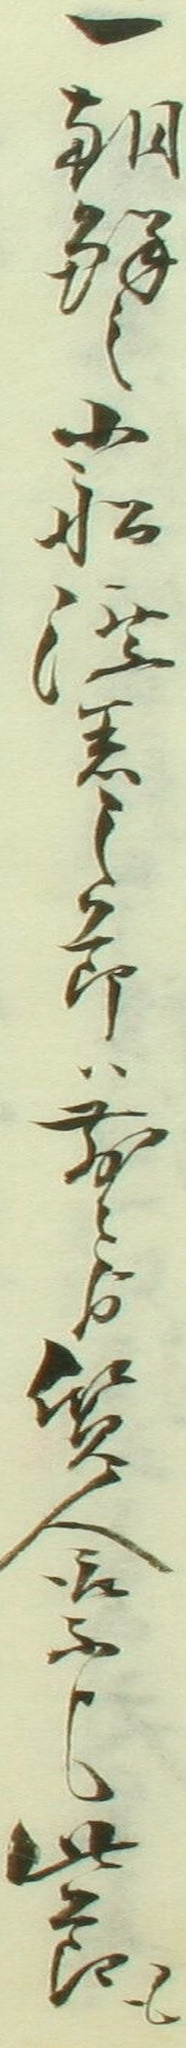一朝鮮之小船漂着之節ハ前々ゟ質人取不申候此節も
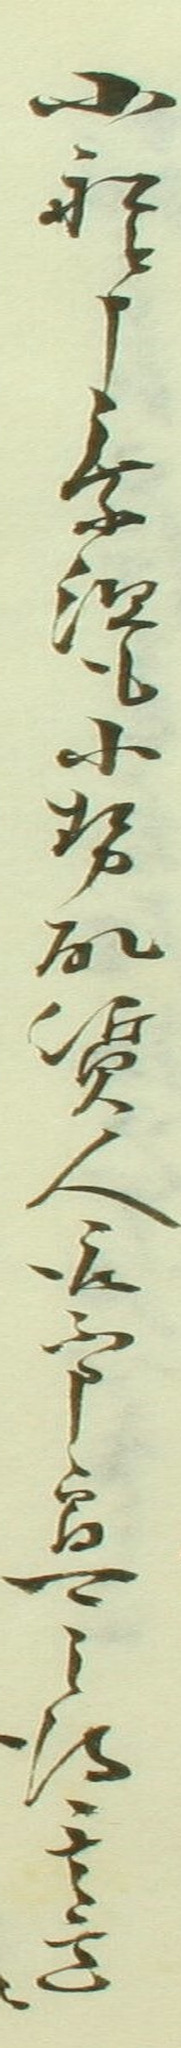小船と申乗組も小勢故質人取不申候間可被得其意候
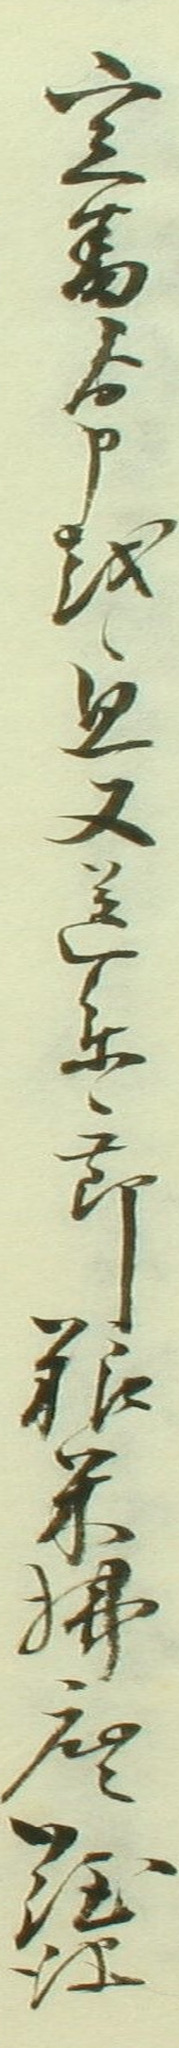定番より申越候且又送参候節糧米払底難儀
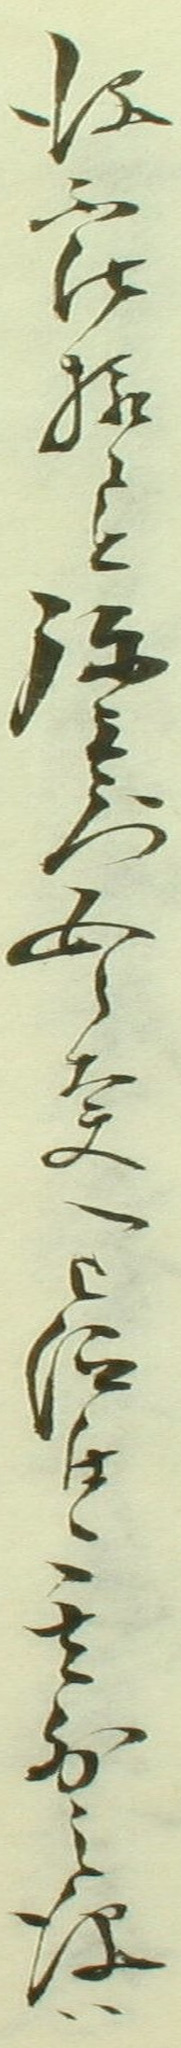儀不仕様ニと弥左衛門五郎大夫へ被仰付候其外之儀ハ
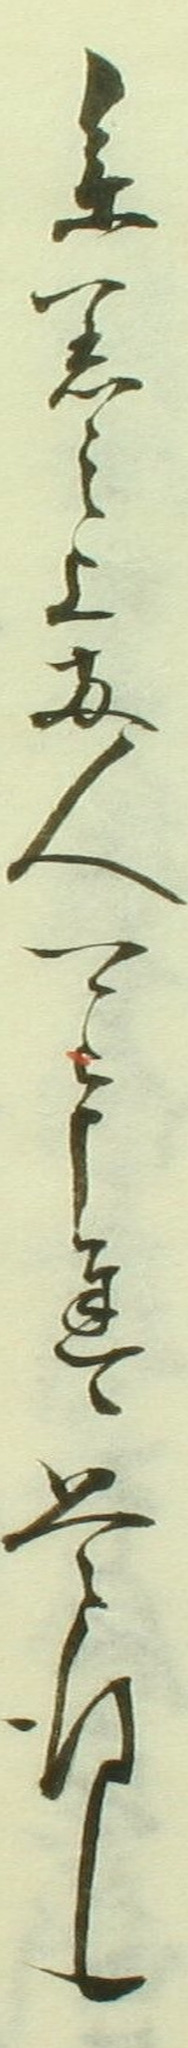参着之上両人可被申達候恐々謹言
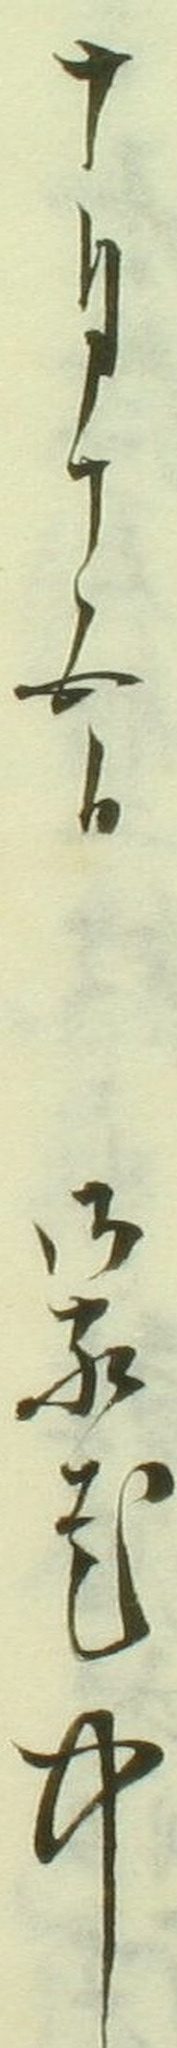十月十五日御家老中
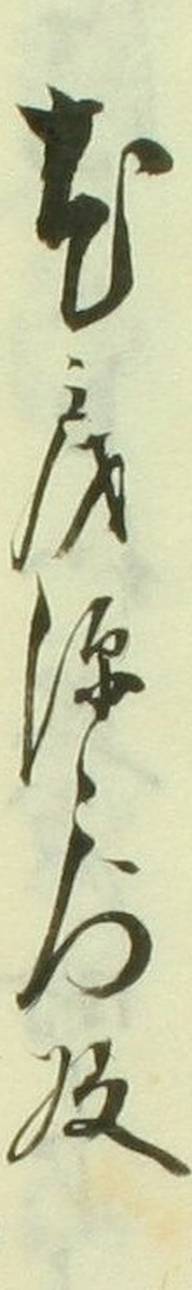花房源右衛門
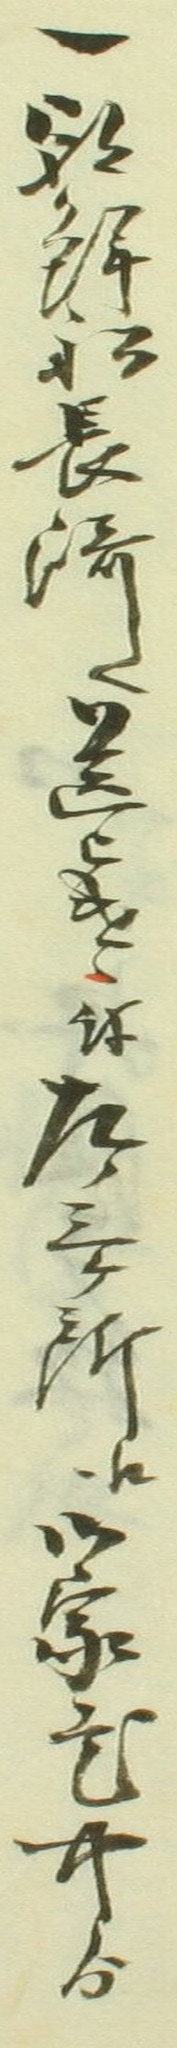一朝鮮船長崎へ送被遣候付左ノ三ヶ所江御家老中ゟ
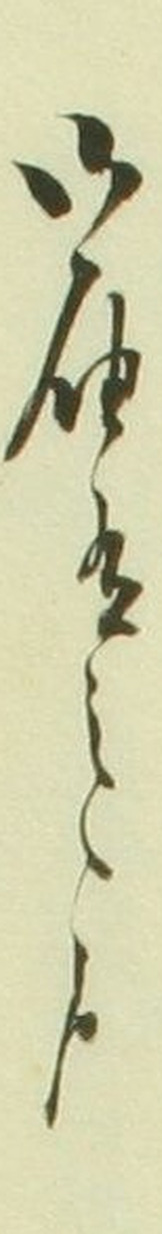御届有之候以上
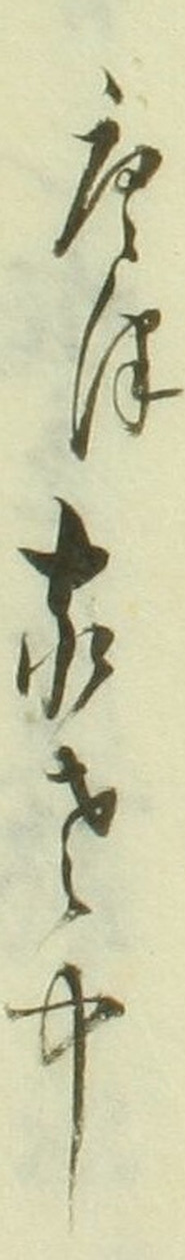唐津家老中
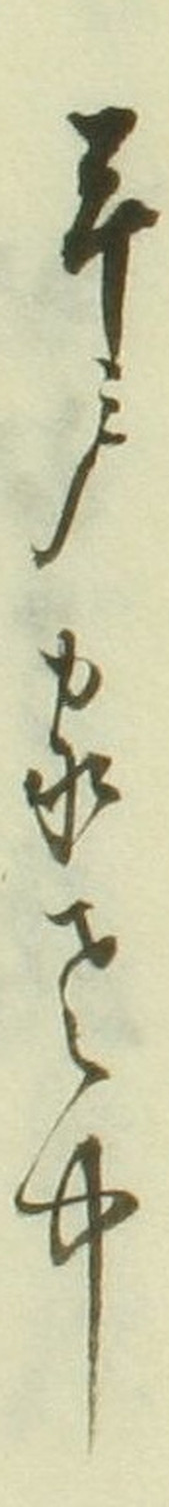平戸家老中
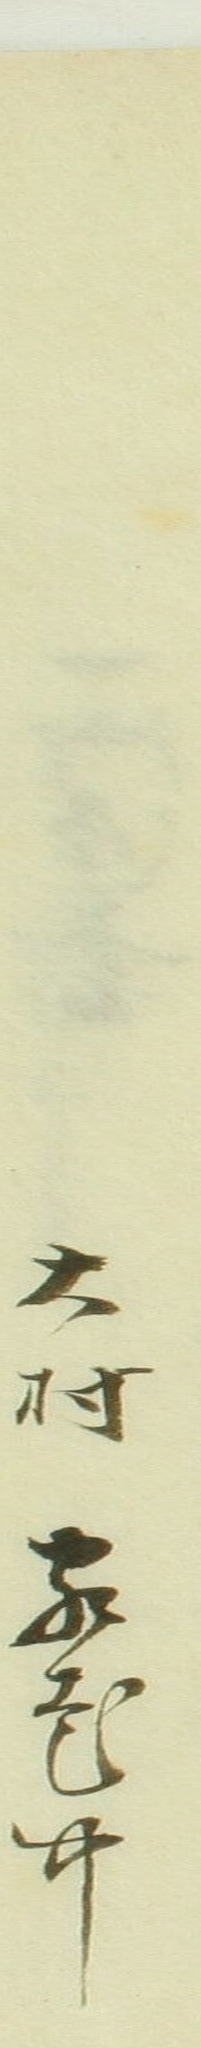大村家老中
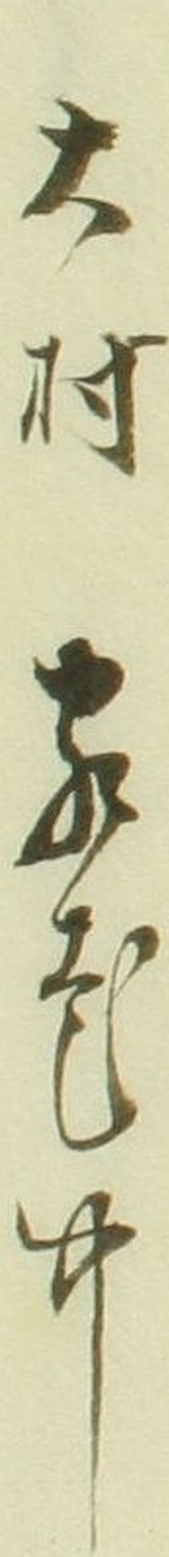大村家老中
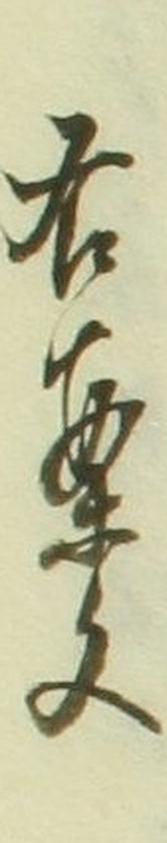右案文
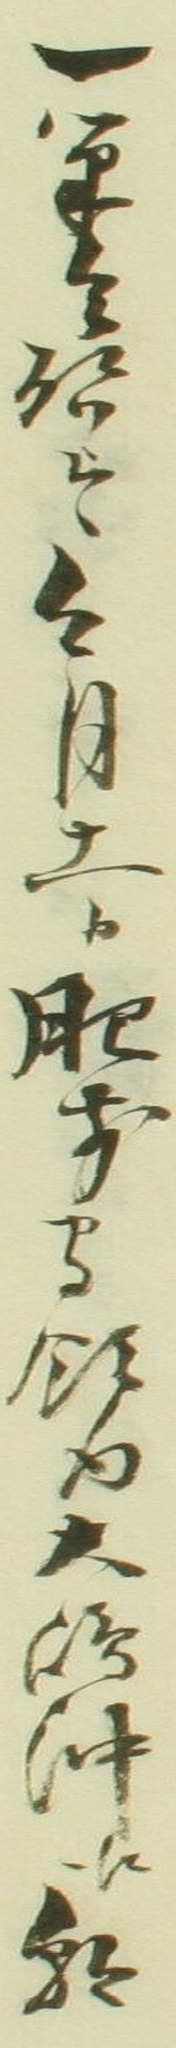一筆令啓上候今月十一日肥前守領内大嶋沖江朝
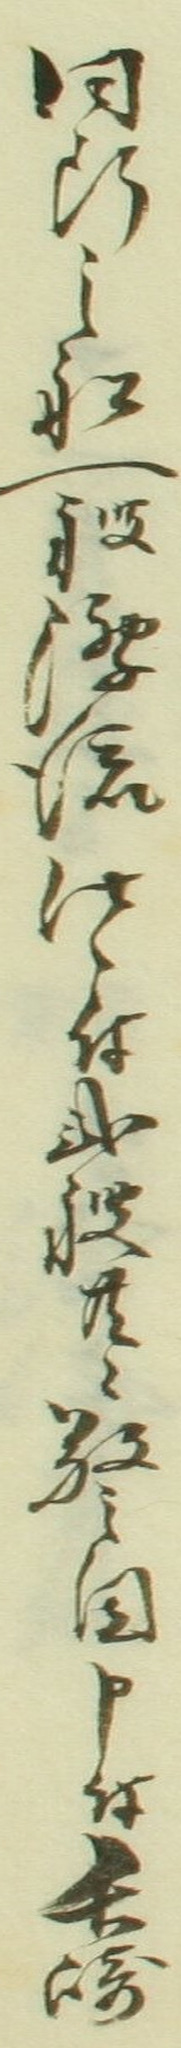同断之船一艘漂流仕候付二艘共ニ警固申付長崎
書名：異国船漂着記
